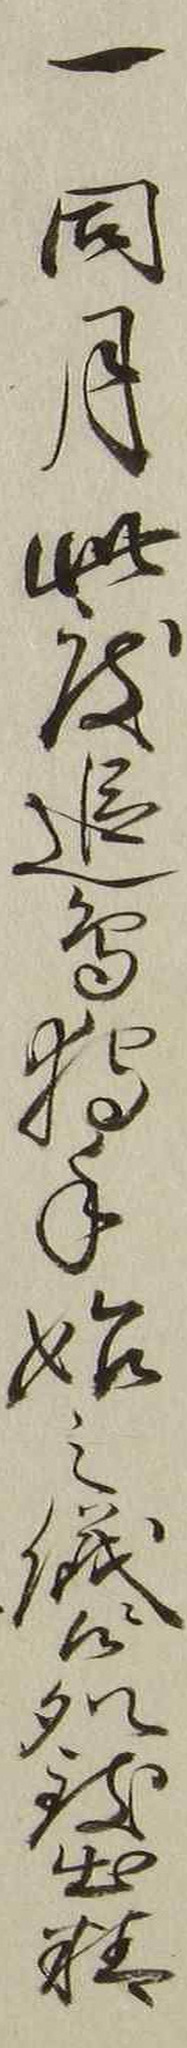一同月此度追鳥狩手始之儀に候処致出精
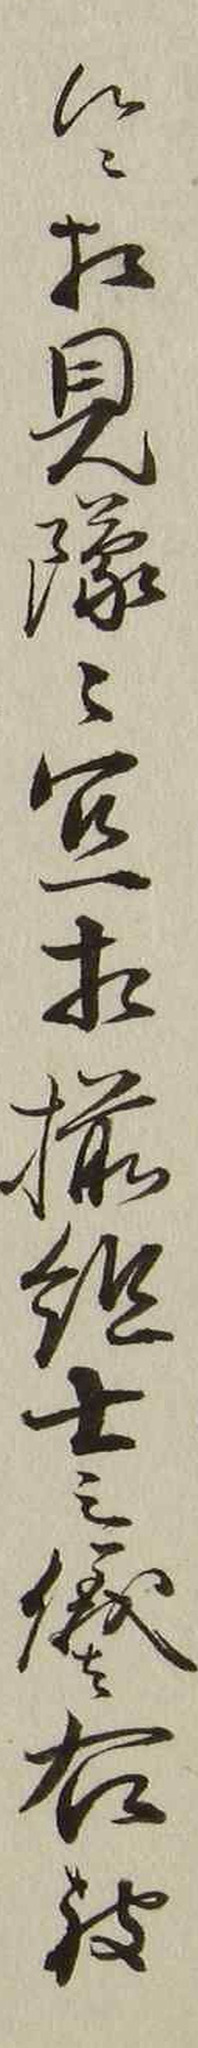候に相見隊々宜相揃組士之儀は右被
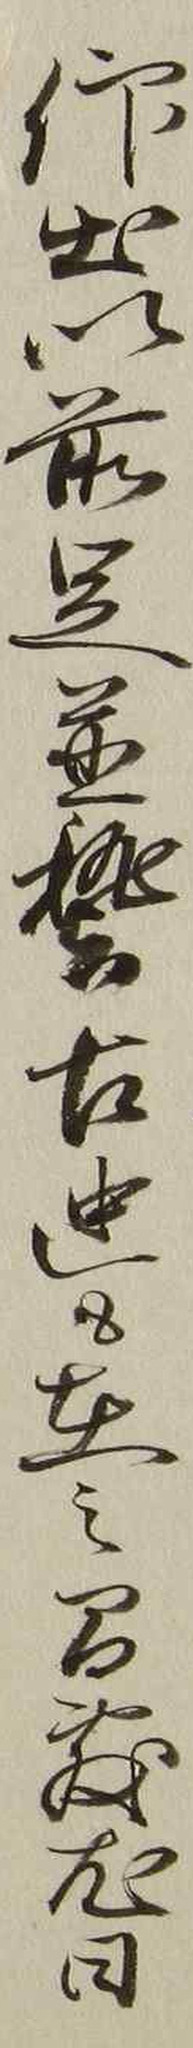仰出以前足並稽古迚も在之間敷尤日
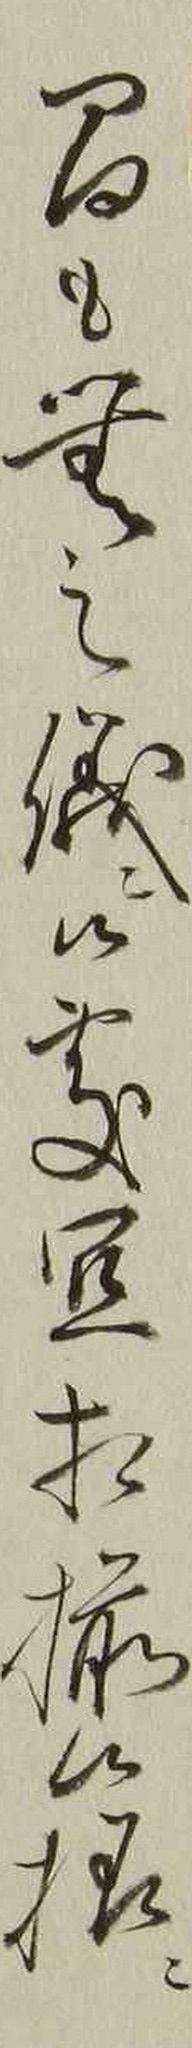間も無之儀に候処宜相揃候様に
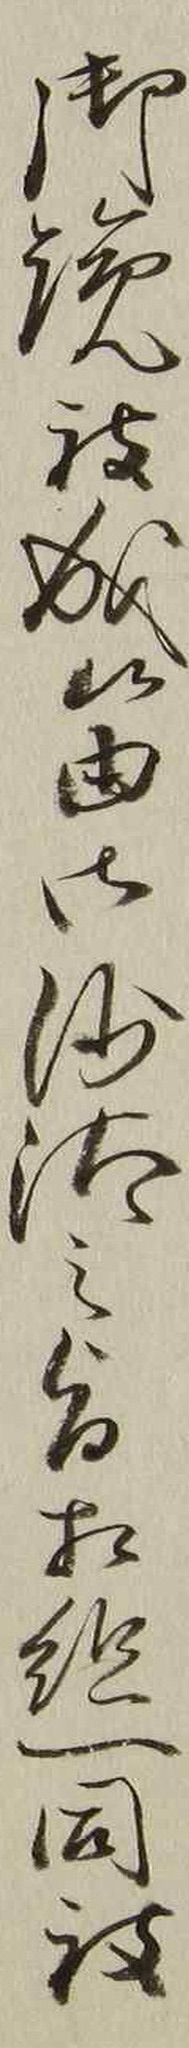御覧被成候由御沙汰之旨相組一同被
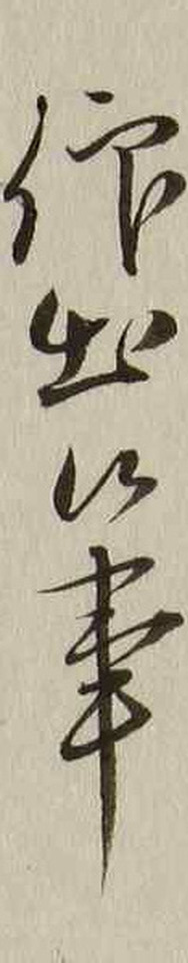仰出候事
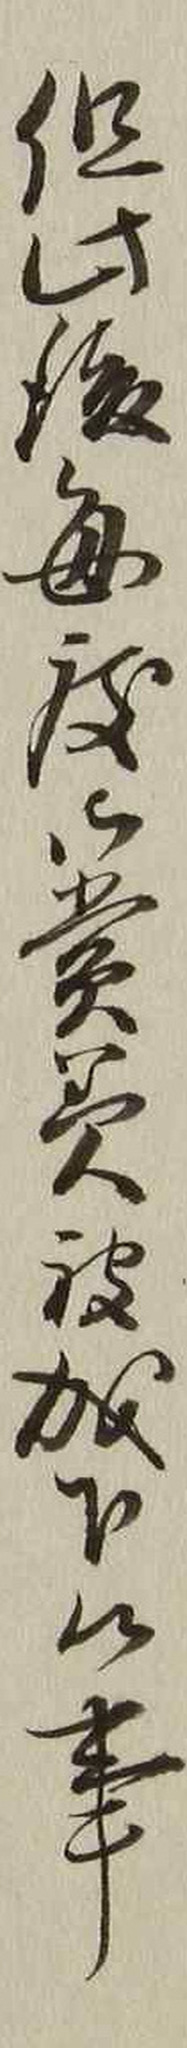但此後毎度御賞美被成下候事
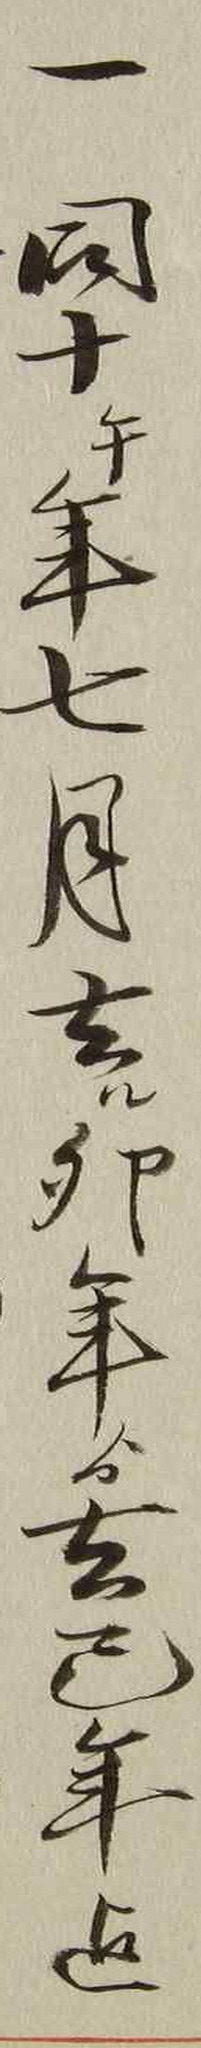一同十午年七月去る卯年ゟ去巳年迄
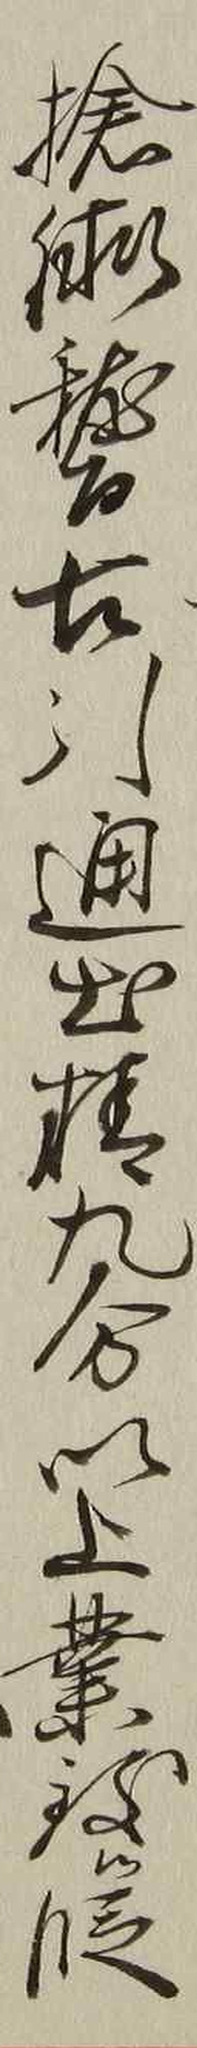槍術稽古引通出精九分以上業致候段
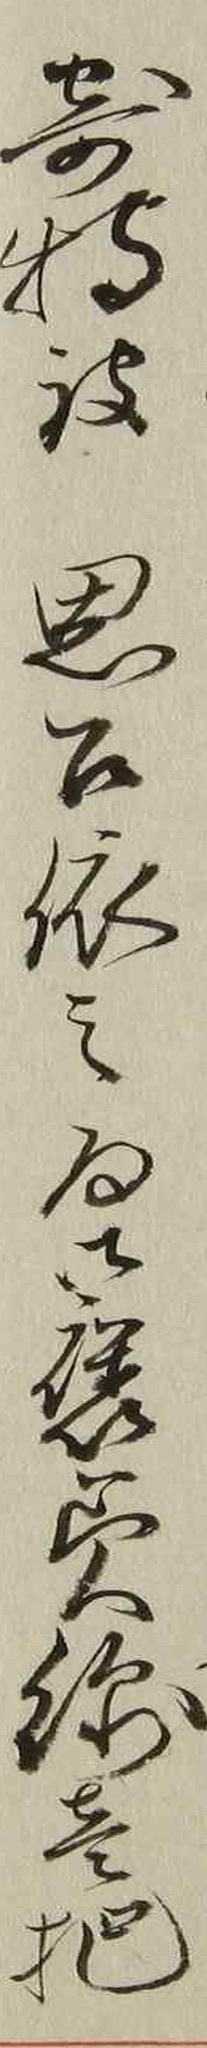寄持被思召依之為御褒美綿壱把
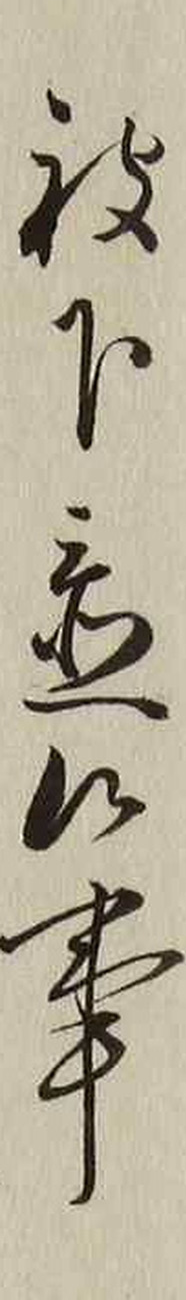被下置候事
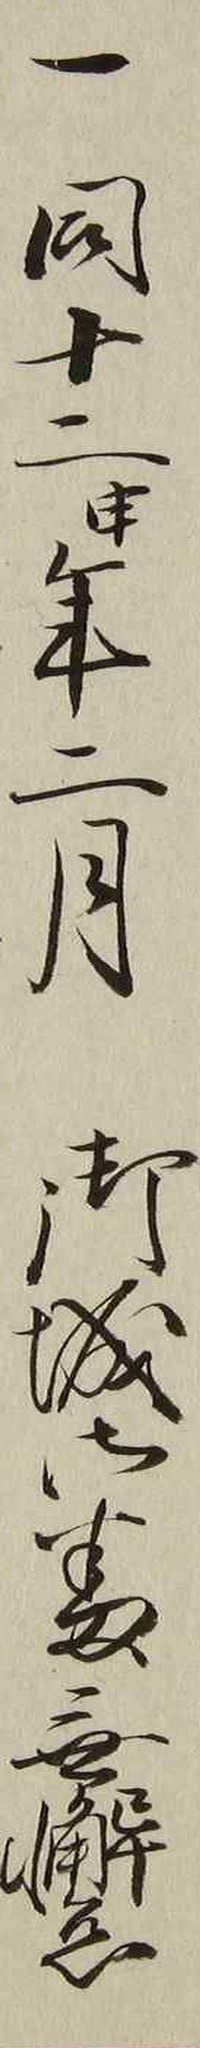一同十二申年二月御城御番無懈怠
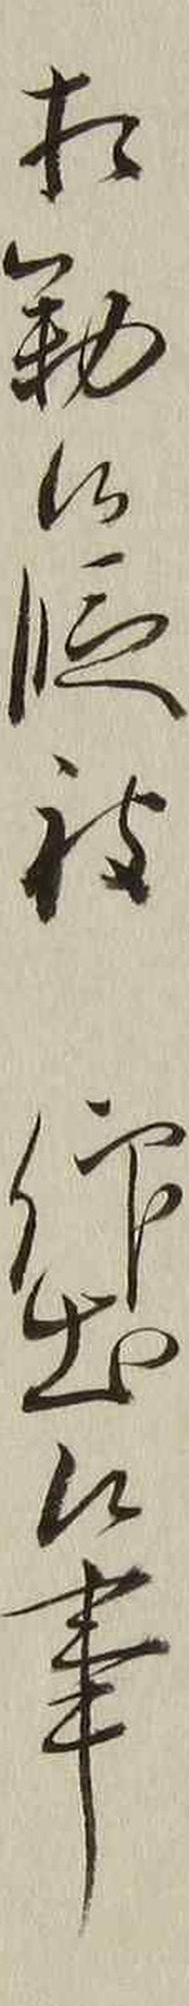相勤候段被仰出候事
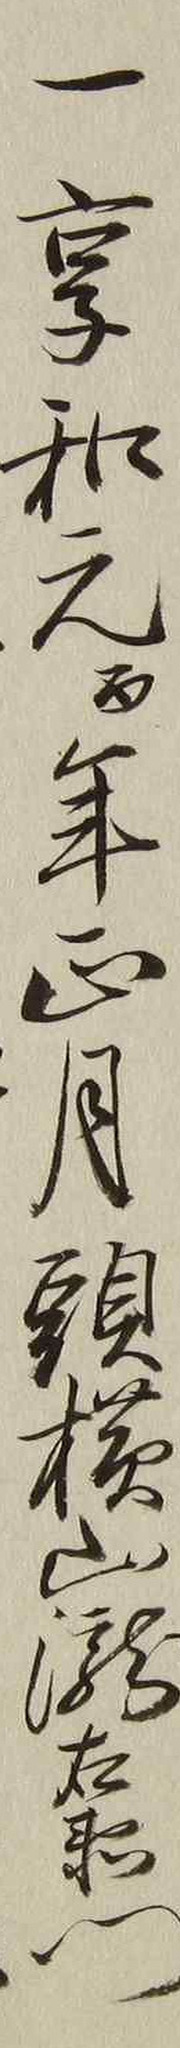一享和元酉年正月頭横山滝右衛門
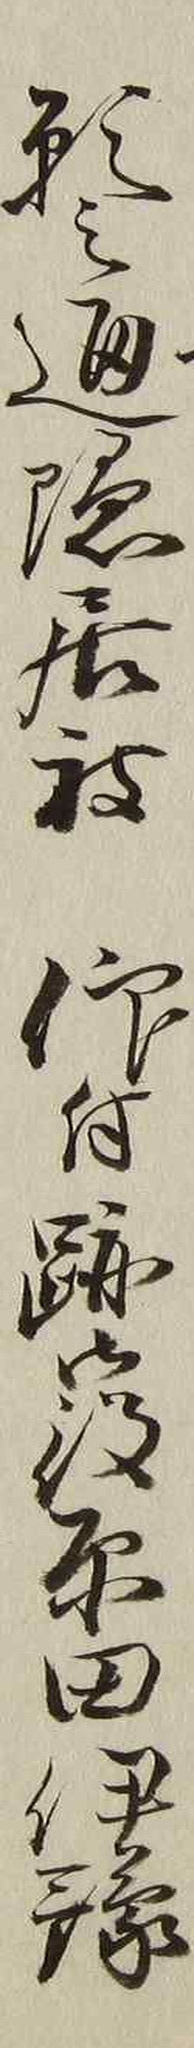願之通隠居被仰付跡御役原田伊予
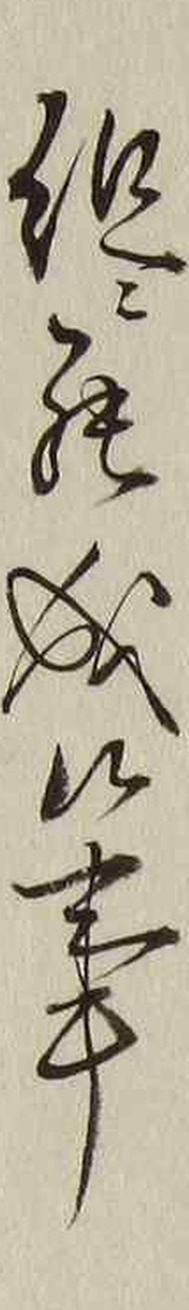組に罷成候事
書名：諸士系譜　巻之157　ね之部1
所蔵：会津若松市立会津図書館
